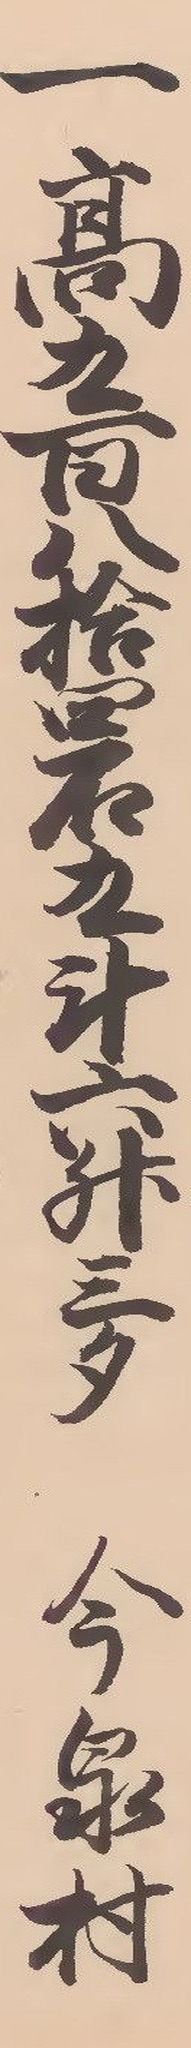一高九百八拾四石九斗六升三勺今泉村

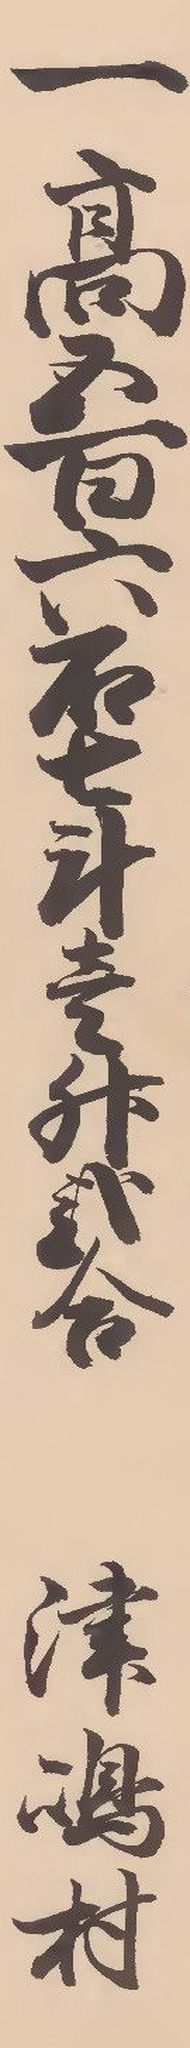一高五百六石七斗壱升弐合津島村
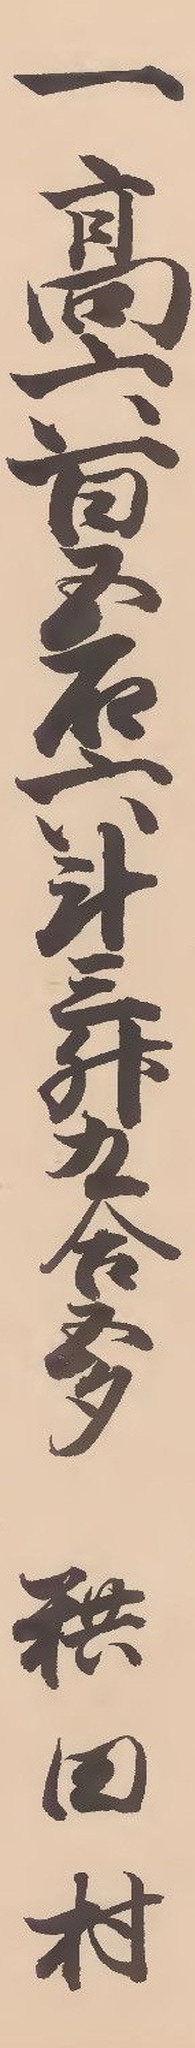一高六百五石六斗三升九合五勺粠田村
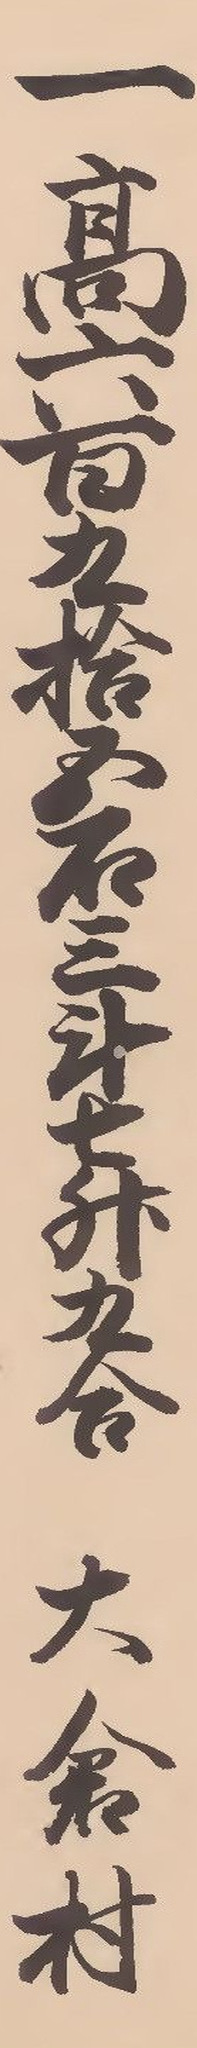一高六百九拾五石三斗七升九合大倉村
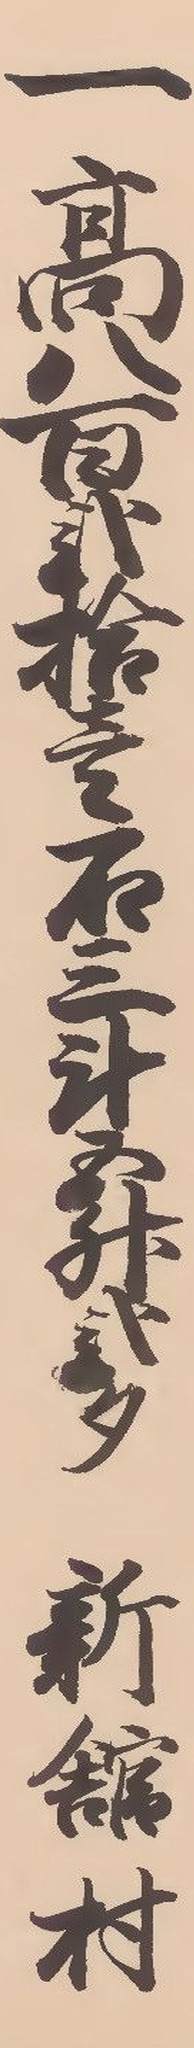一高八百弐拾壱石三斗五升弐勺新館村
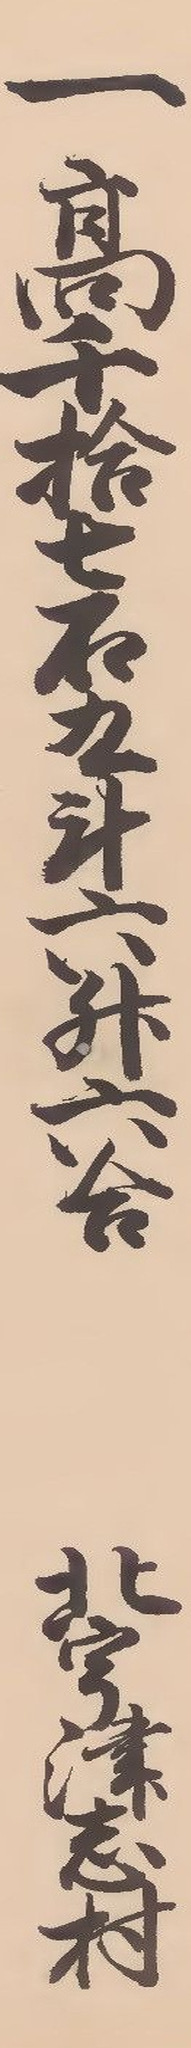一高千拾七石九斗六升六合北宇津志村
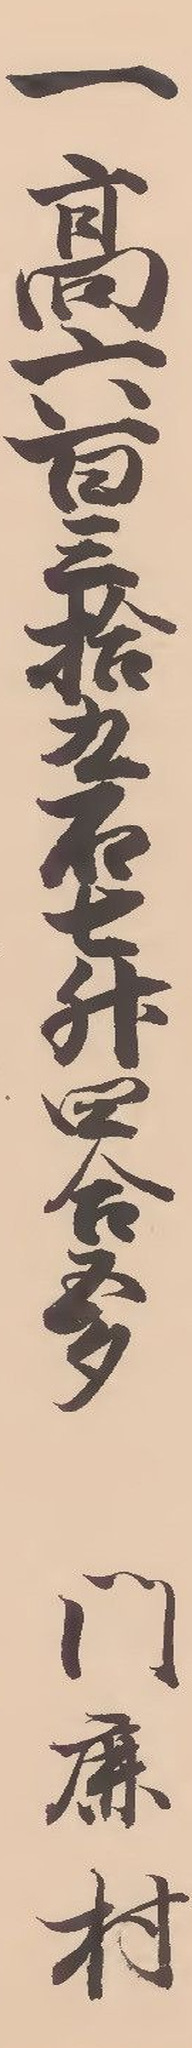一高六百三拾九石七升四合五勺門鹿村
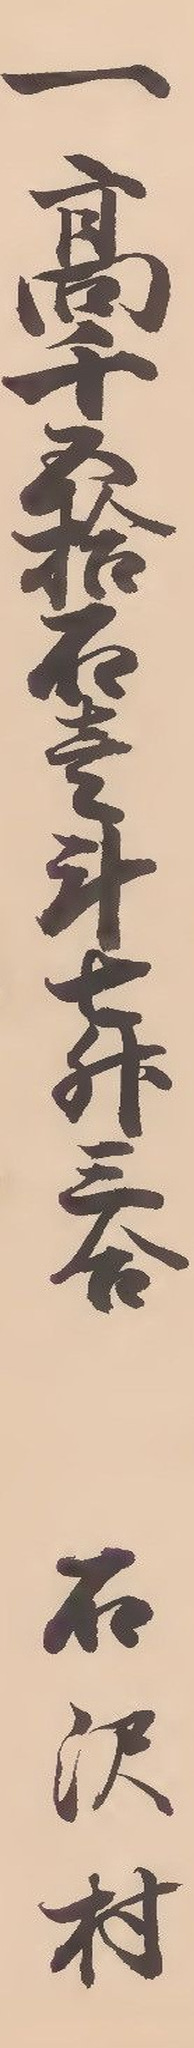一高千五拾石壱斗七升三合石沢村

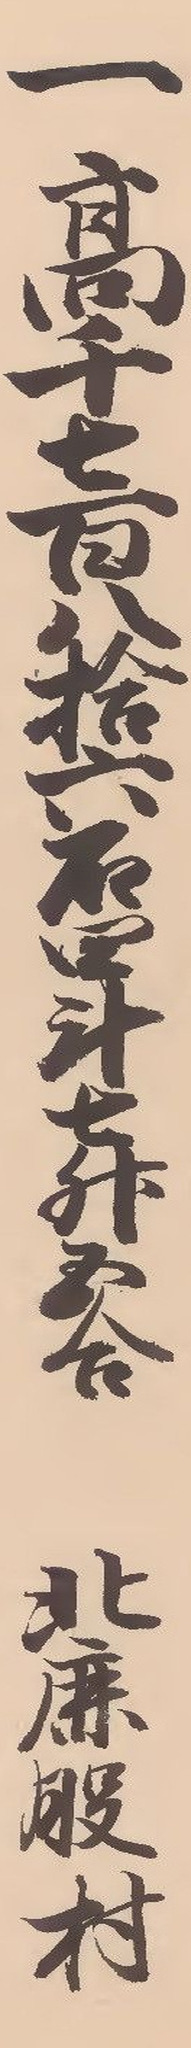一高千七百八拾六石四斗七升五合北鹿股村
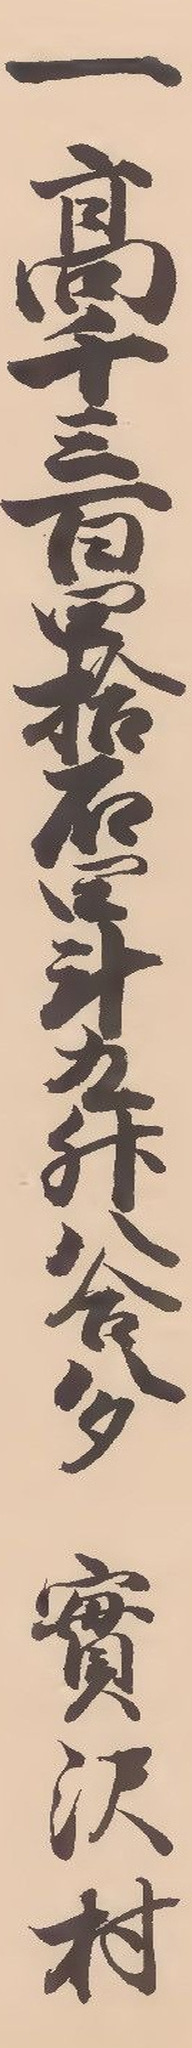一高千三百四拾石四斗九升八合八勺実沢村
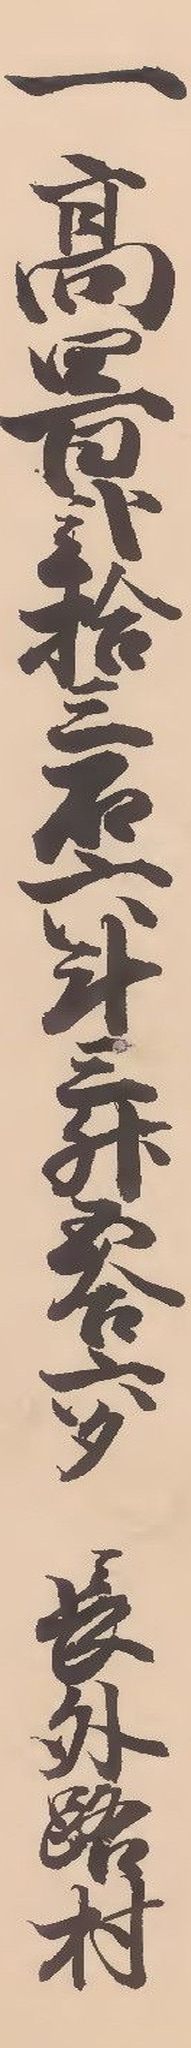一高四百弐拾三石六斗三升五合六勺長外路村
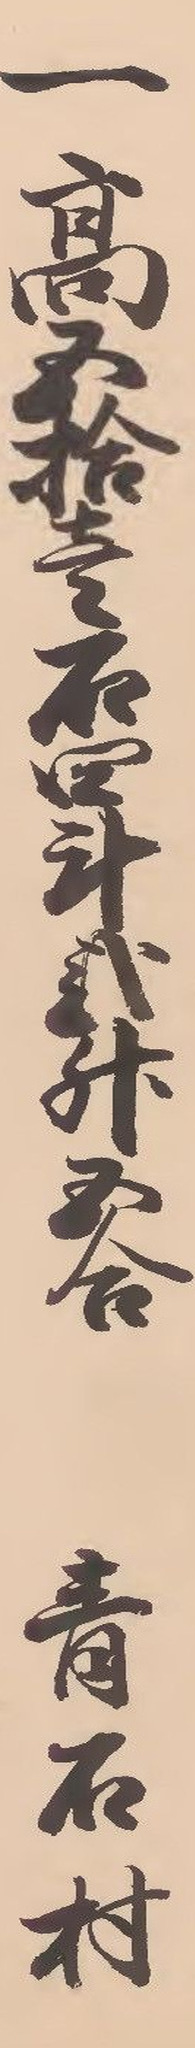一高五拾壱石四斗弐升五合青石村
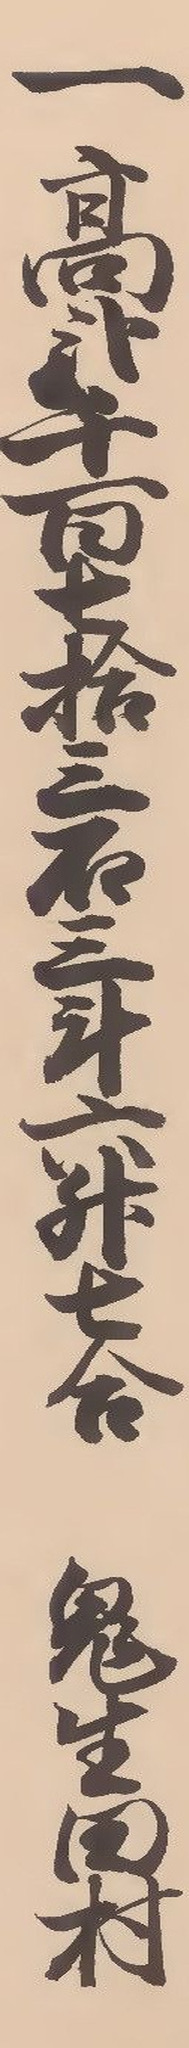一高弐千百七拾三石三斗六升七合鬼生田村
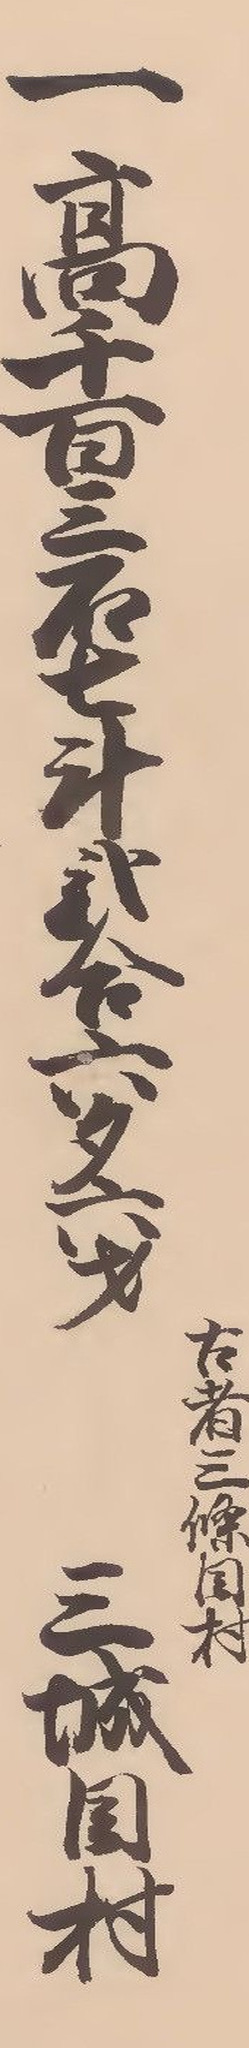一高千百三石七斗弐合六勺六才三城目村
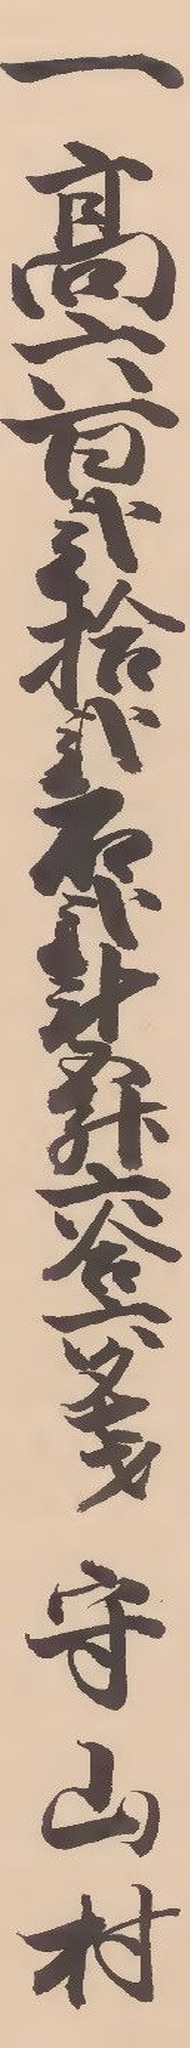一高六百弐拾弐石弐斗五升六合六勺七才守山村
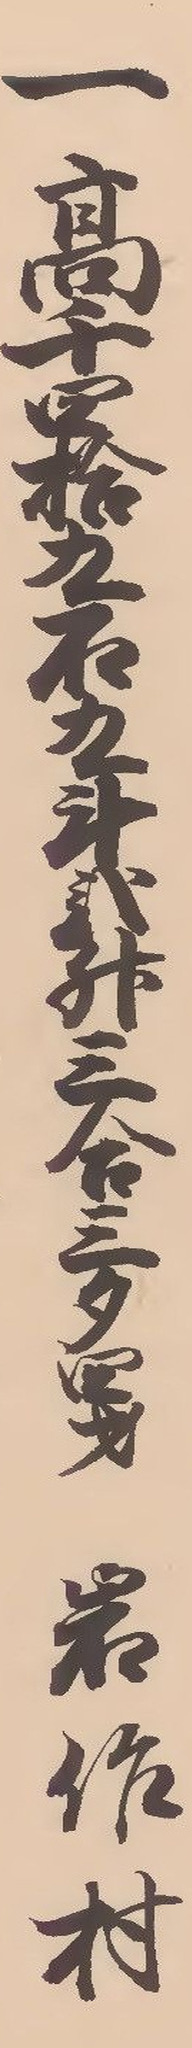一高千四拾九石九斗弐升三合三勺四才岩作村
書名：陸奥国郷帳　２
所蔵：国立公文書館 National Archives of Japan
